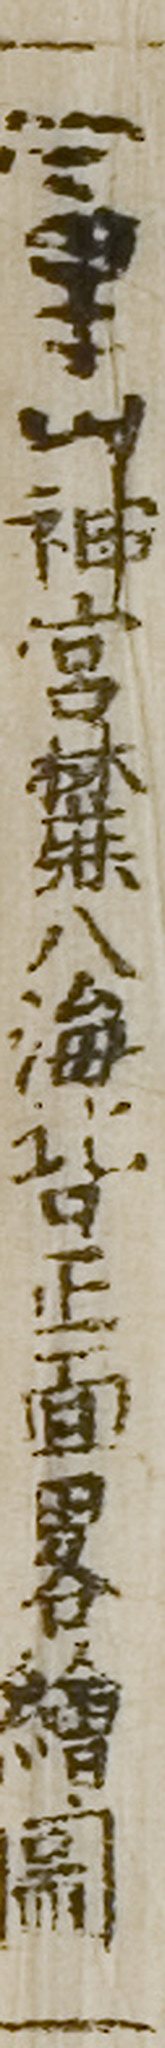富士山神宮麓八海北口正面略絵図
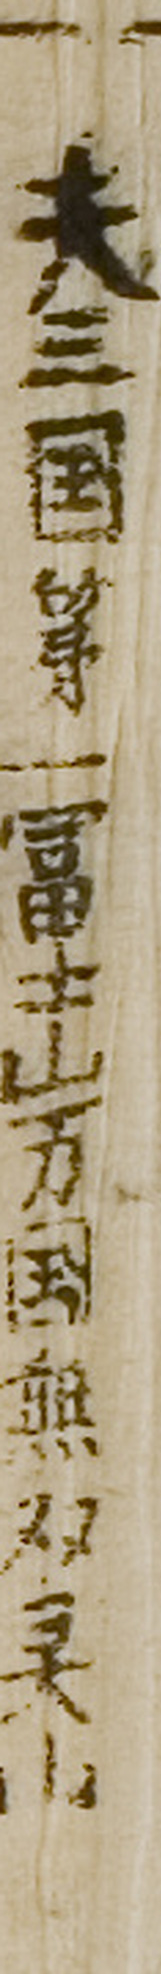夫三国第一富士山万国無双霊山
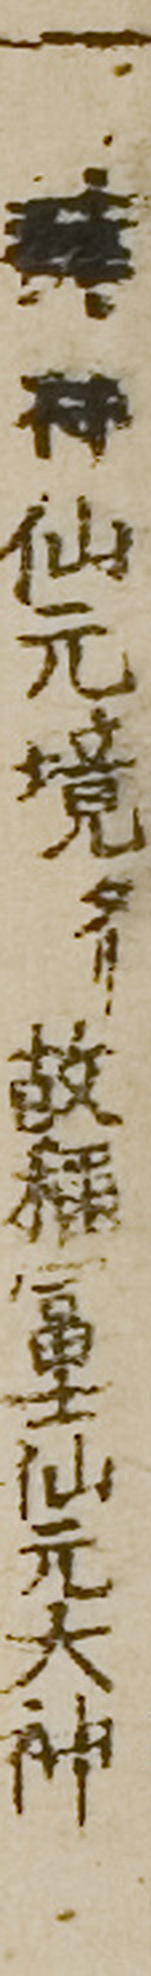諸神仙元境たり故称富士仙元大神
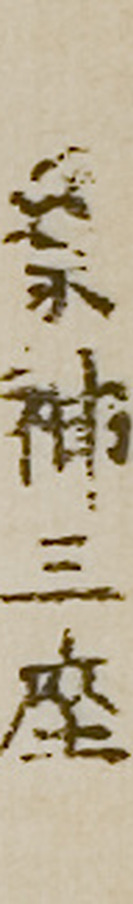祭神三座
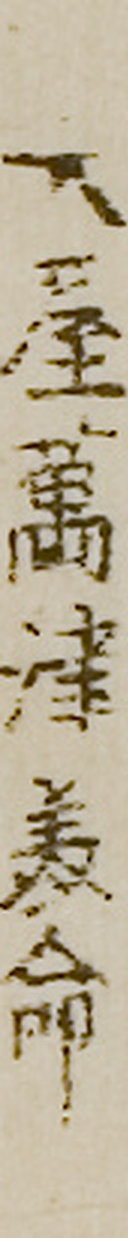大屋萬津美命
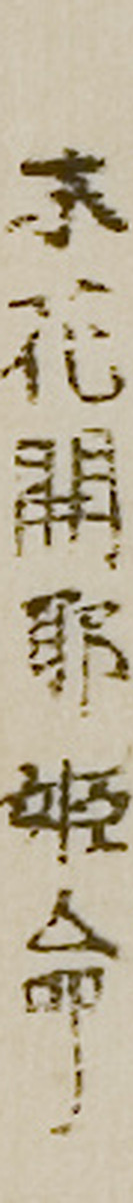木花開耶姫命
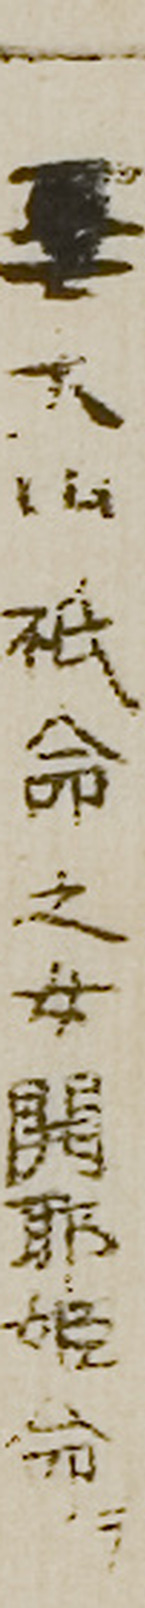娶大山祇命之女開耶姫命を
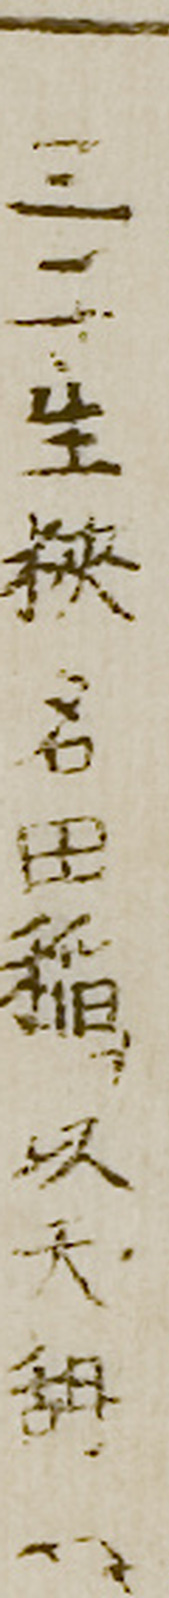三子生狭名田稲を以天甜
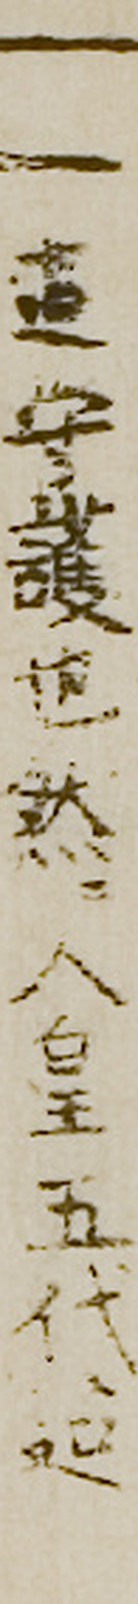一道守護也然に人皇五代迄
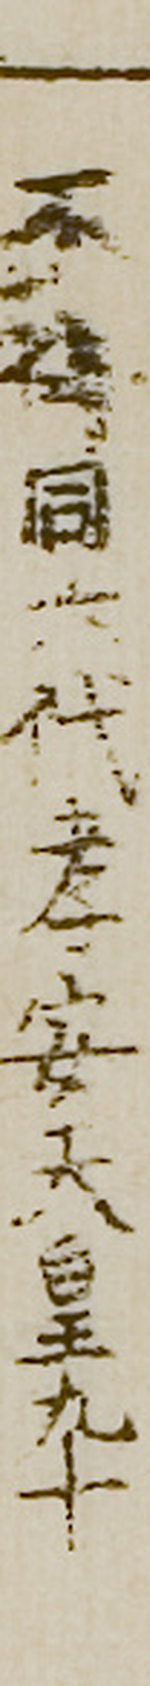不得同六代孝安天皇九十
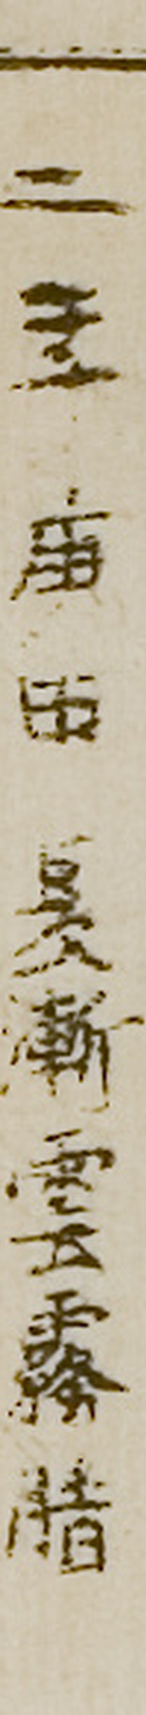二年庚申夏漸雲霧晴
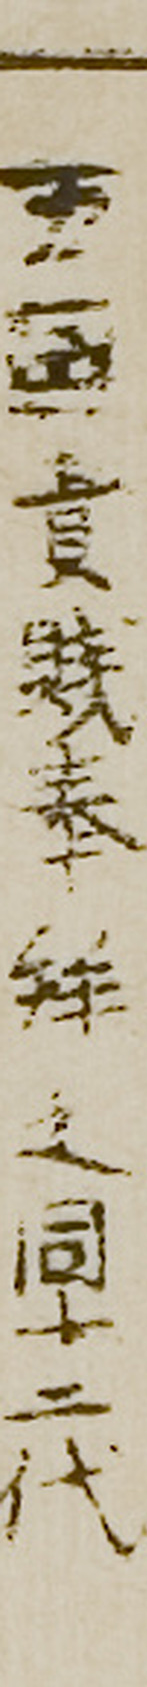万国貴賎奉拝之同十二代
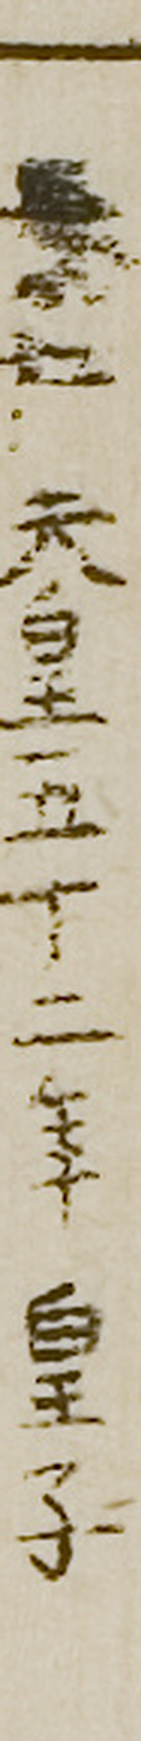景行天皇五十二年皇子
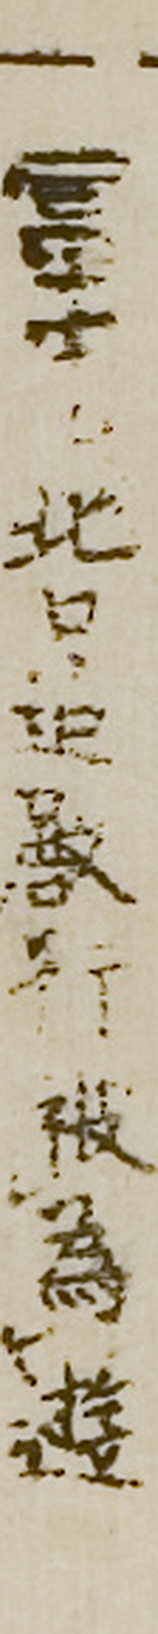富士山北口迄啓行被為遊
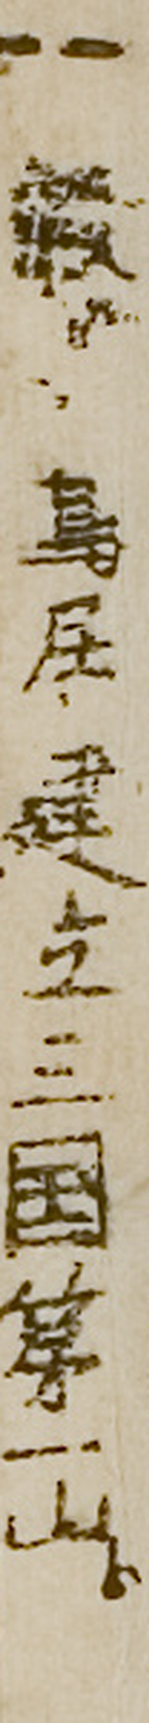仮に大鳥居建立三国第一山と
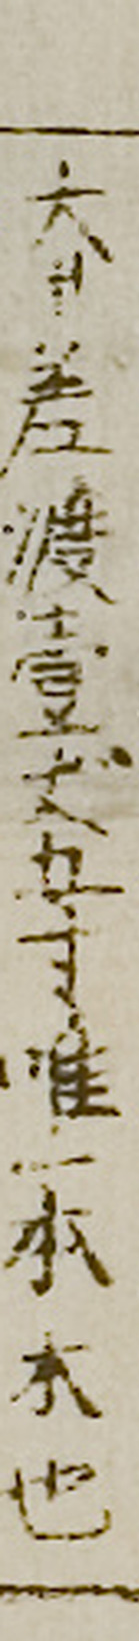大さ差渡壱丈五寸唯一本木也
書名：富士山神宮麓八海北口正面略絵図
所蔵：東京大学総合図書館 General Library in the University of Tokyo, JAPAN
